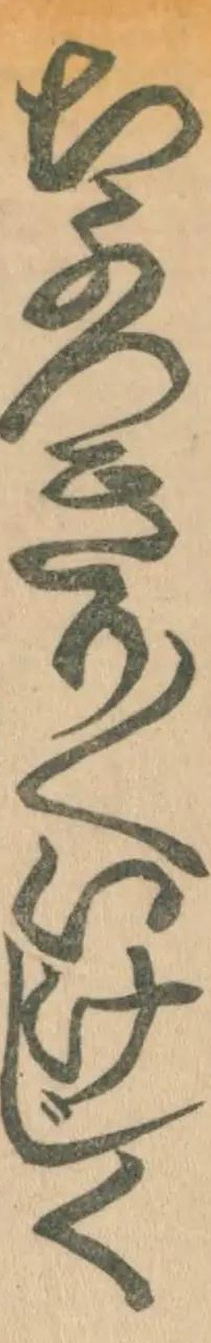ちよつきり〳〵いけじく
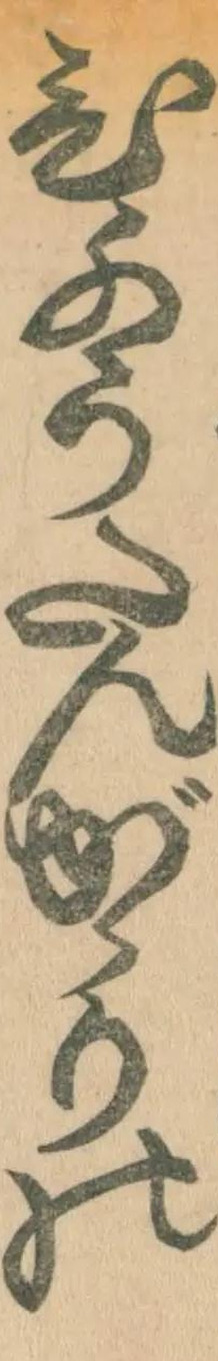ひようたんがゝりの
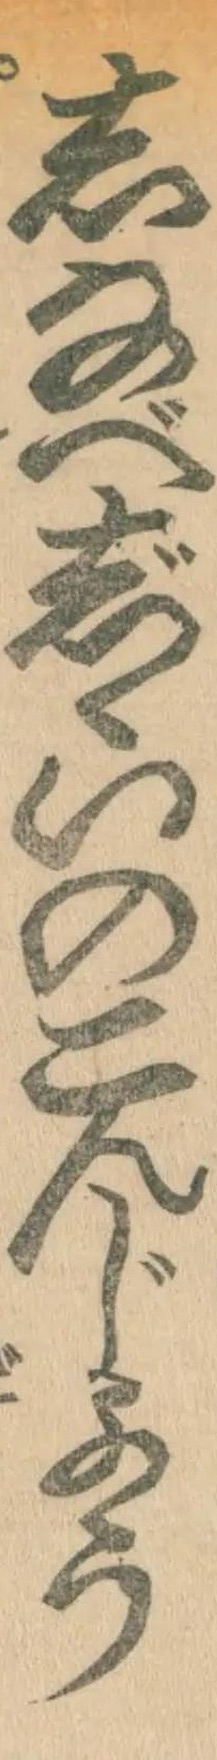しなべじゝいのこんじよう
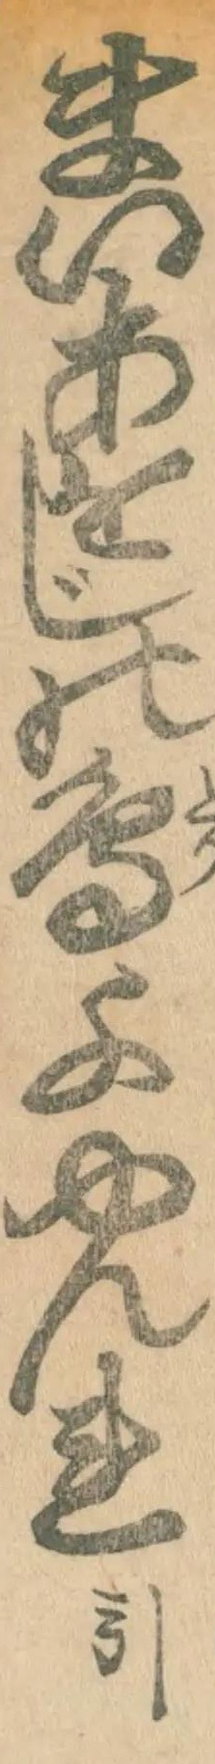まいあをじの鳥よやんれ引

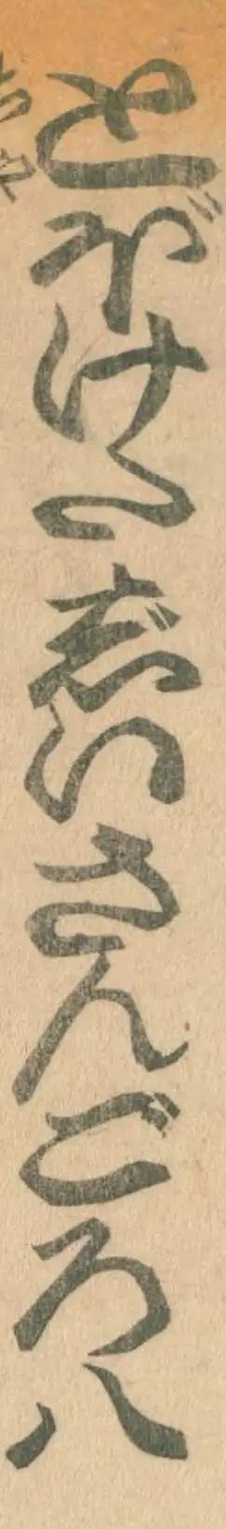とぼけたじいさんごろ八
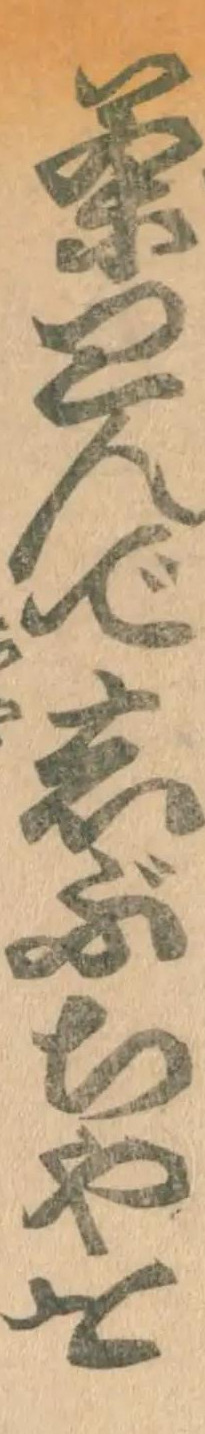茶わんでしぶちやを
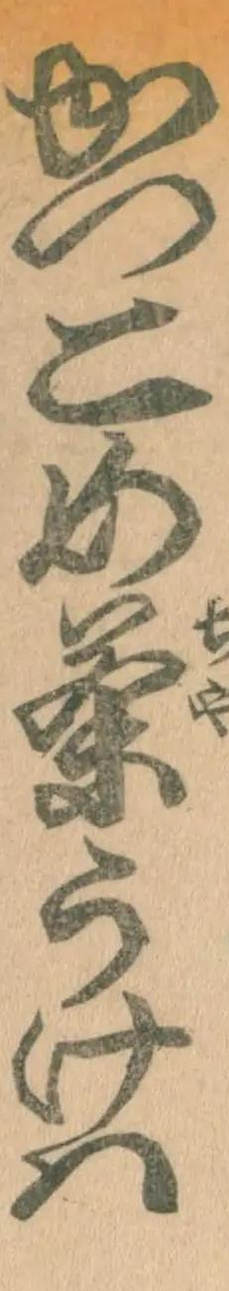かつこめ茶うけは
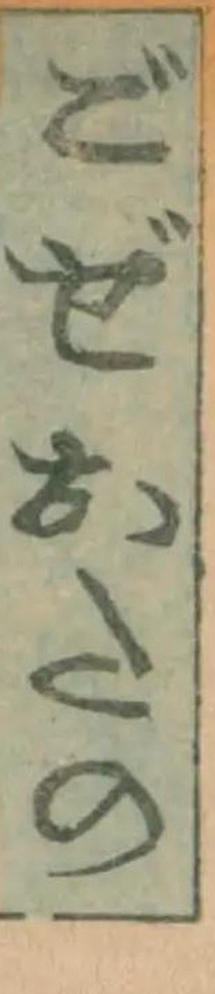ごぜおたの
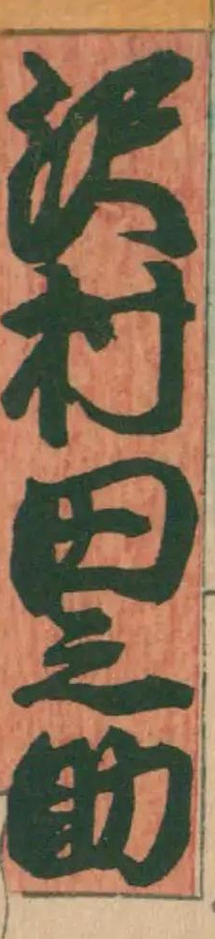沢村田之助
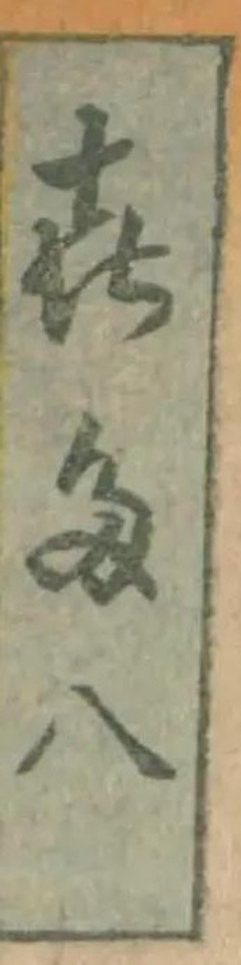喜多八
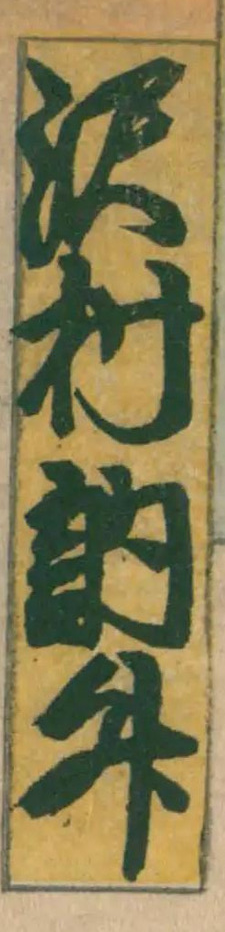沢村訥升
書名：国芳国貞錦絵
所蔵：国立国会図書館 National Diet Library, JAPAN
